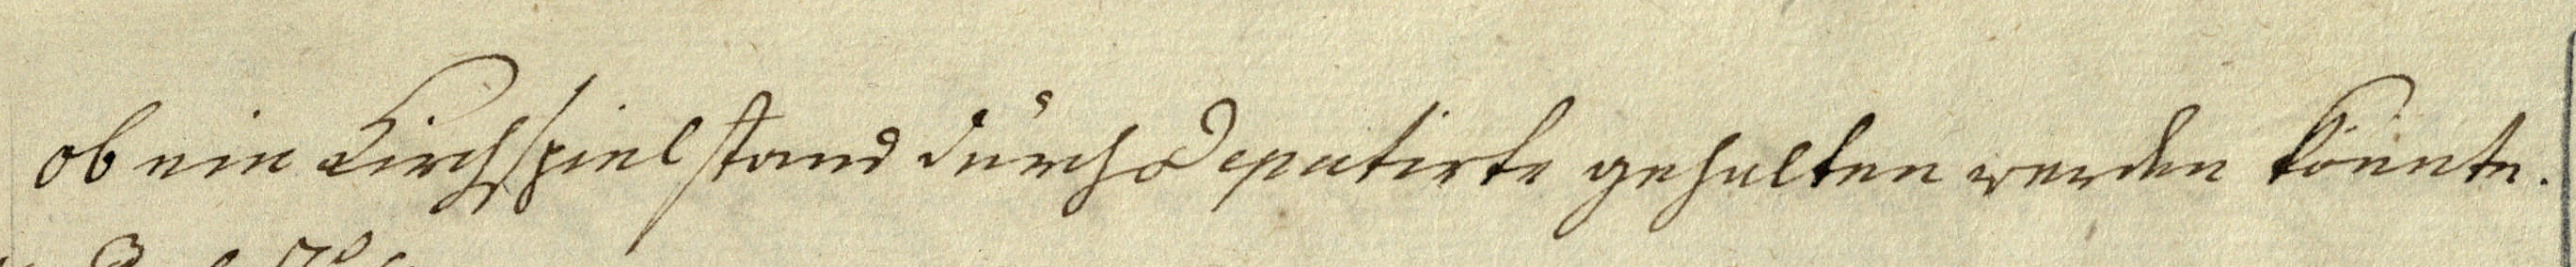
ob ein Kirchspielstand durch Deputirte gehalten werden könnte.
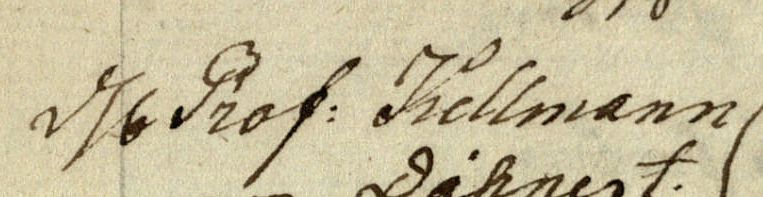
dh Prof. Kellmann.
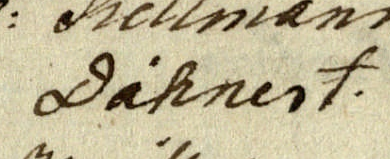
Dähnert.
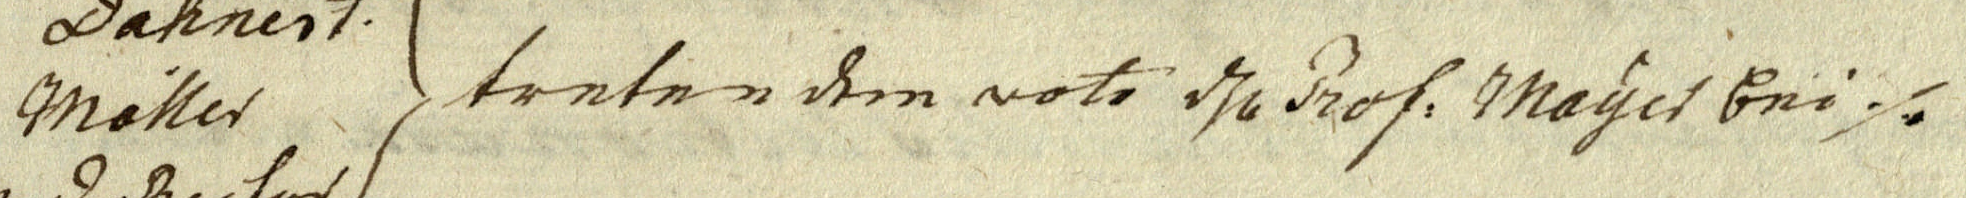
Möller treten dem voto dh Prof. Maÿer bei
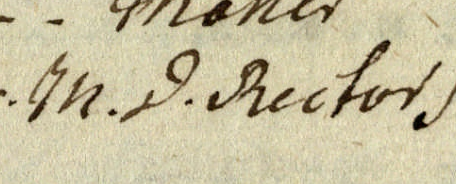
M. D. Rector
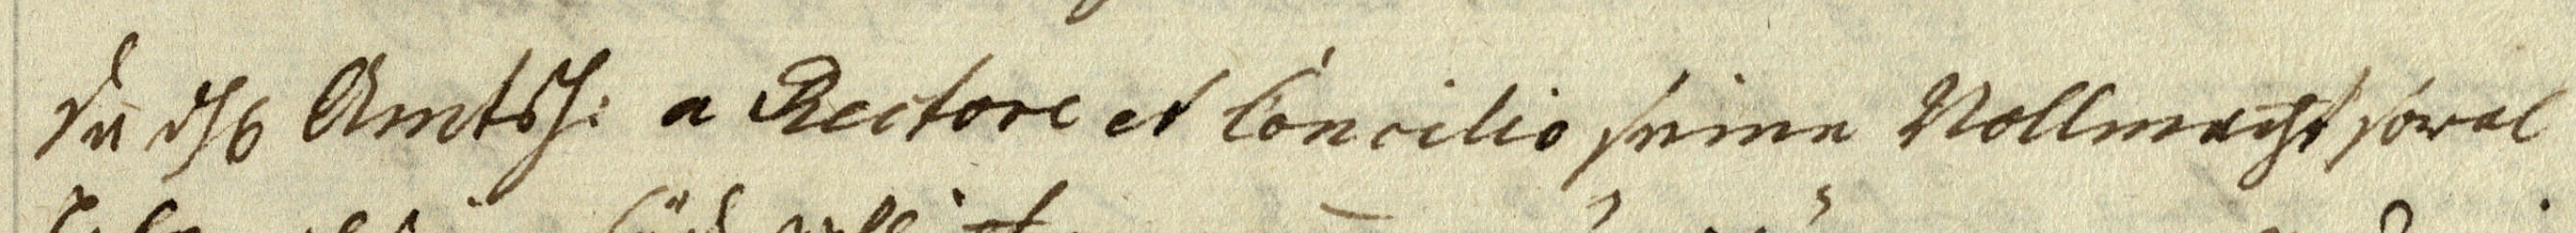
Da dh Amtsh. a Rectore et Concilio seine Vollmacht sowol
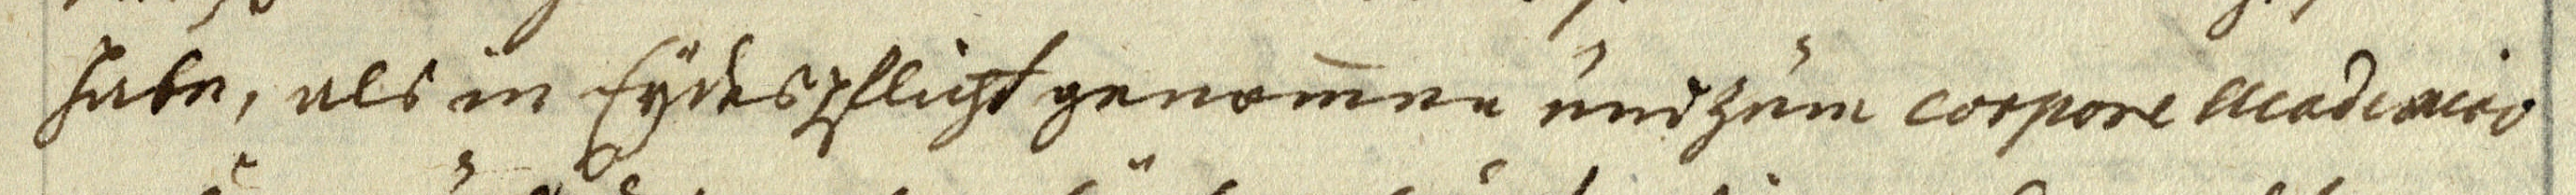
habe, als in Eÿdespflicht genomen und zum corpore Academico
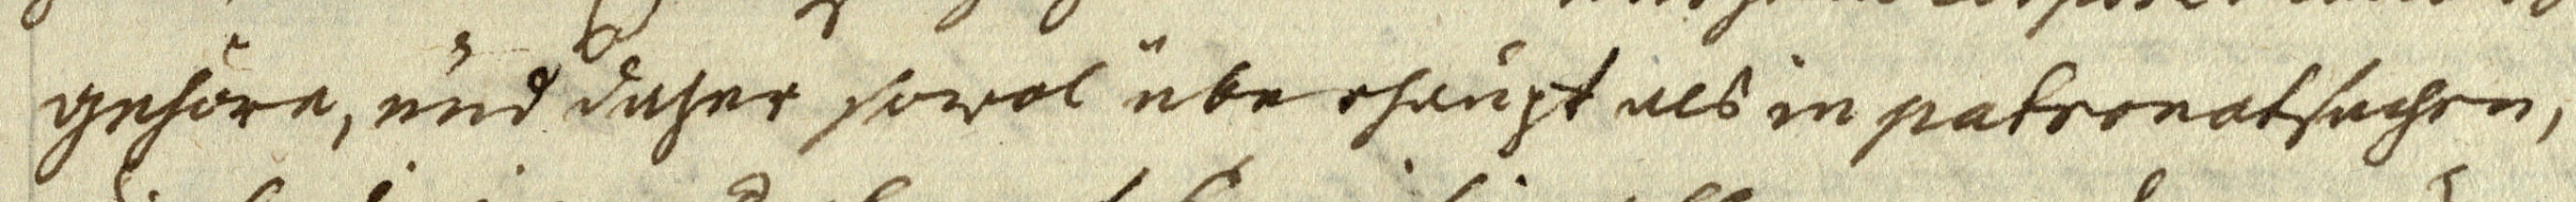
gehöre, und daher sowol überhaupt als in patronatsachen,
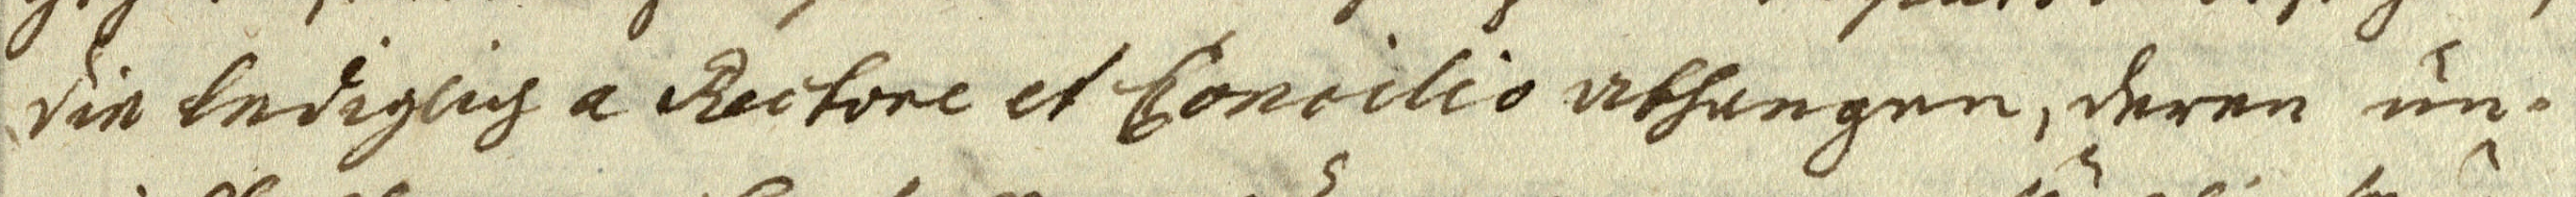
die lediglich a Rectore es Concilio abhangen, deren un¬
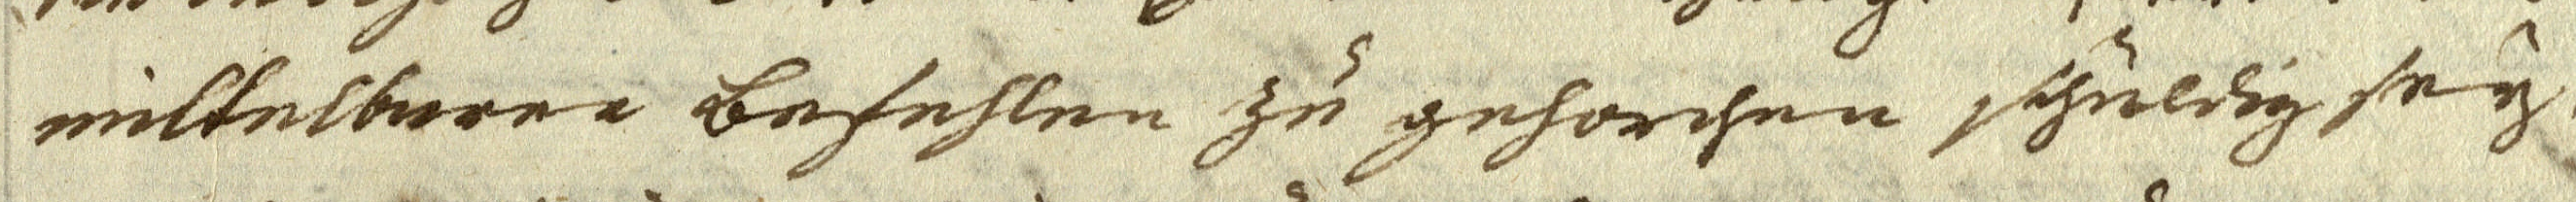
mittelbaren Befehlen zu gehorchen schuldig seÿ,
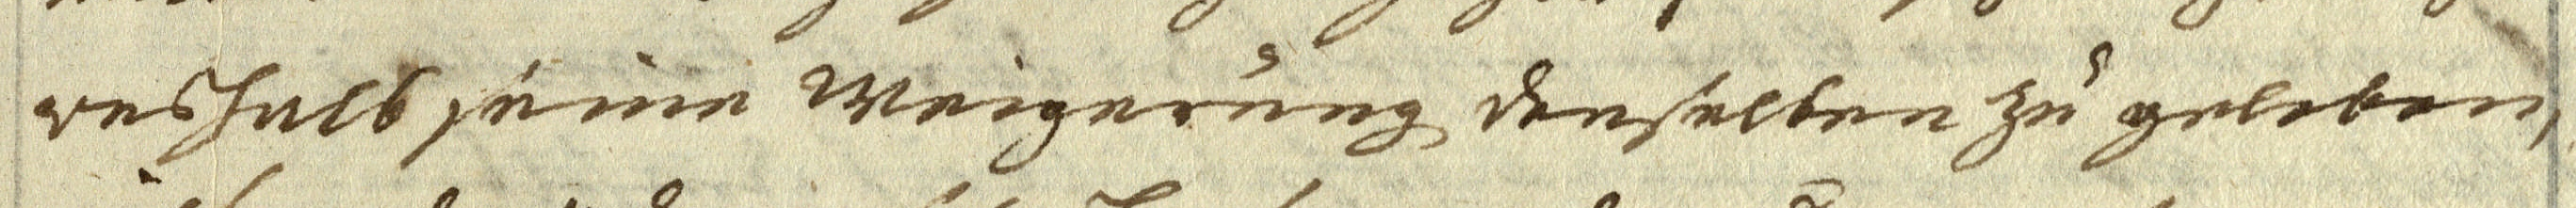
weshalb seine Weigerung denselben zu geleben,
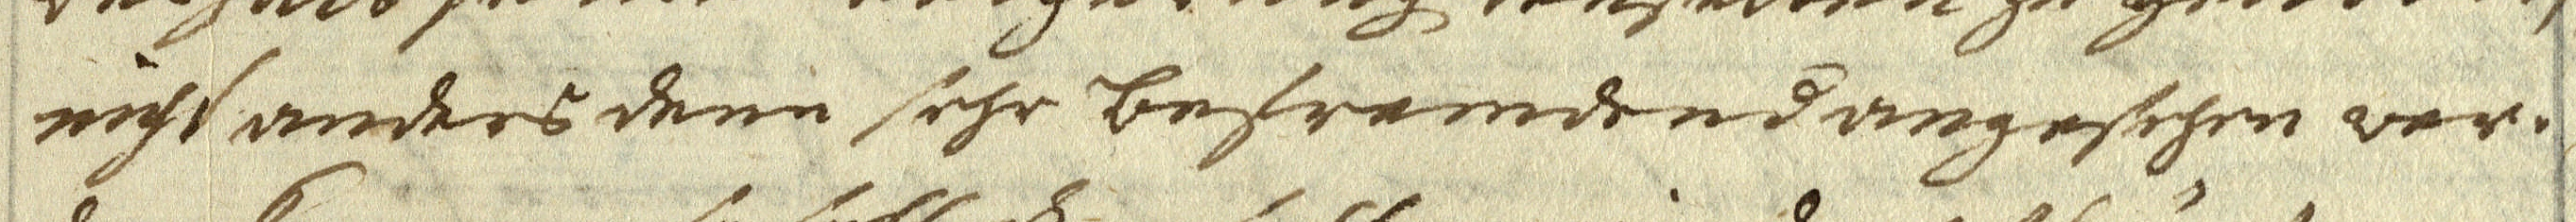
nicht anders denn sehr befremdend angesehen wer¬
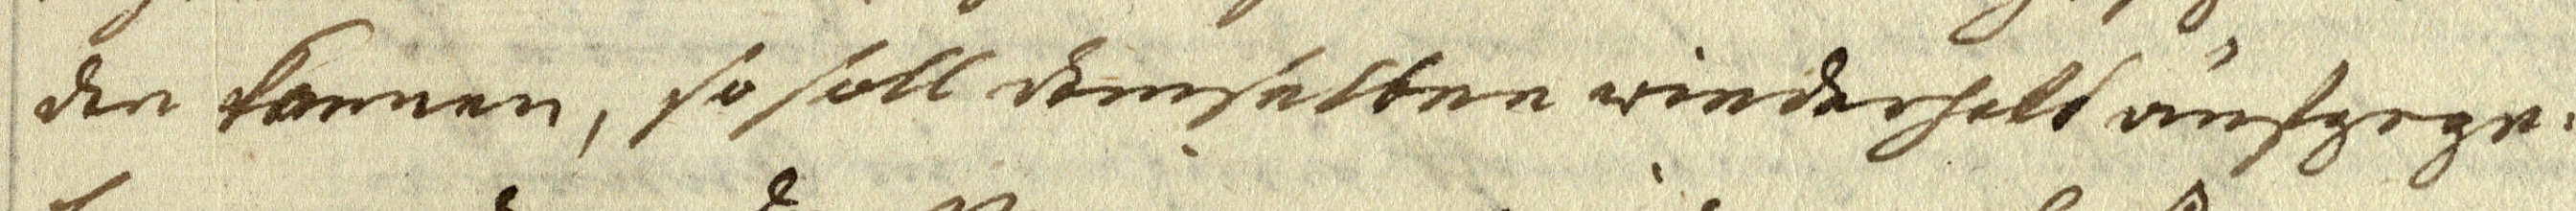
den können, so soll demselben wiederholt aufgege¬
